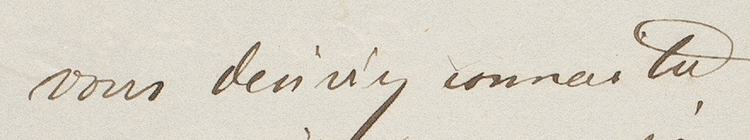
vous desiréz connaitre
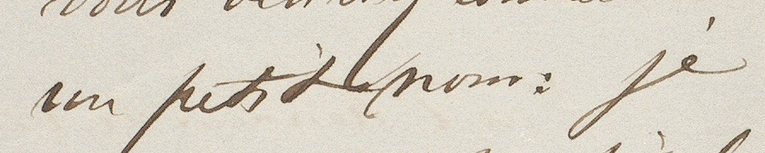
un petit nom: je
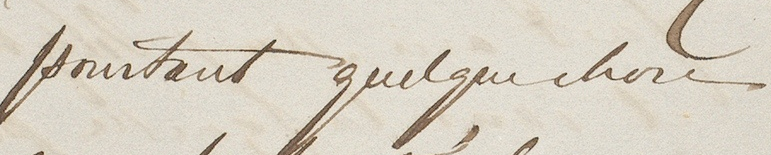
pourtant quelque chose
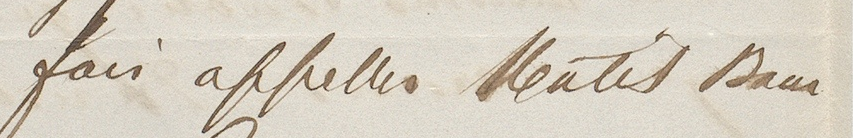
fair appeller ... Baur
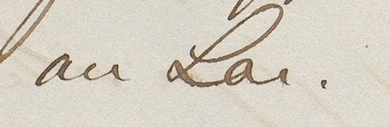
au Lac. –
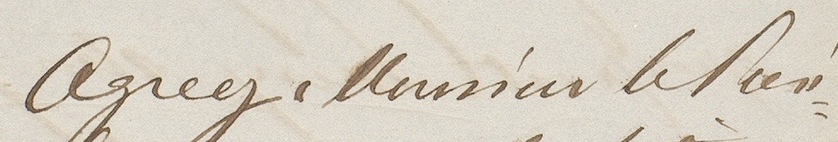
Agreez, Monsieur le Presi-
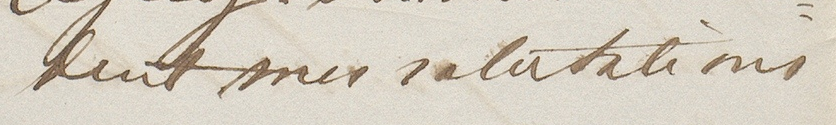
dent mes salutations
